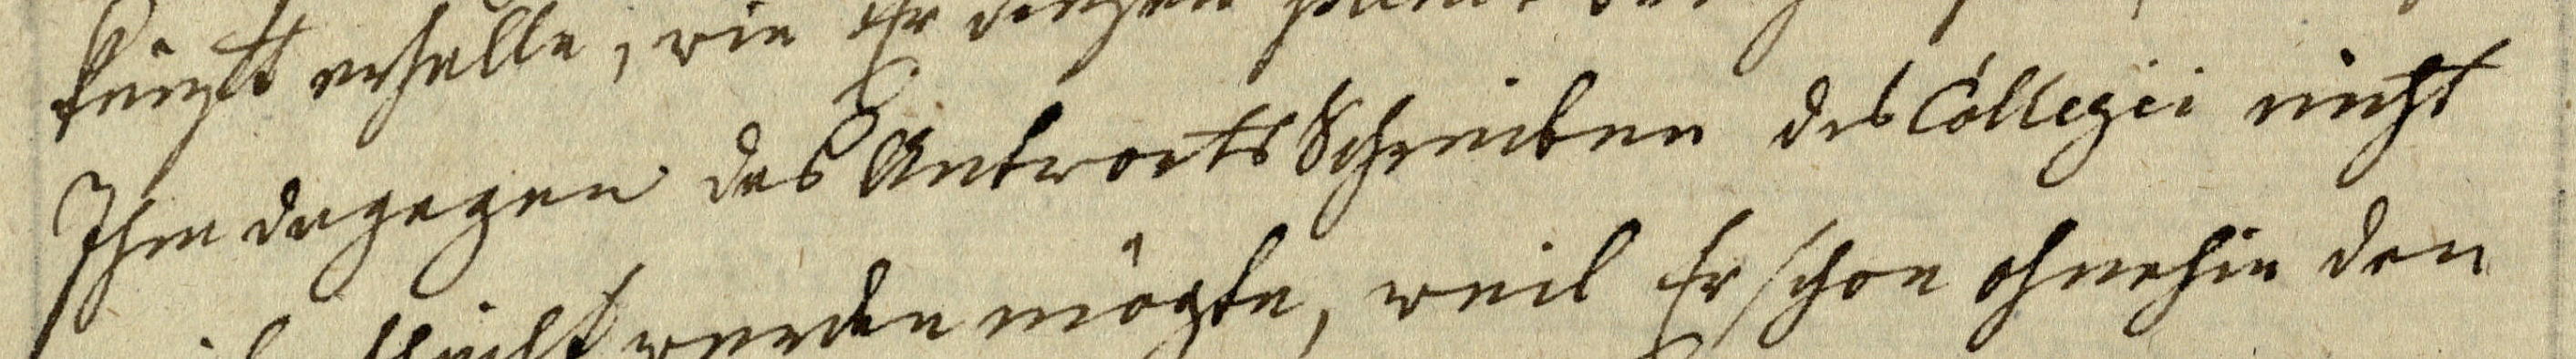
Ihm dagegen das AntwortsSchreiben des Collegii nicht
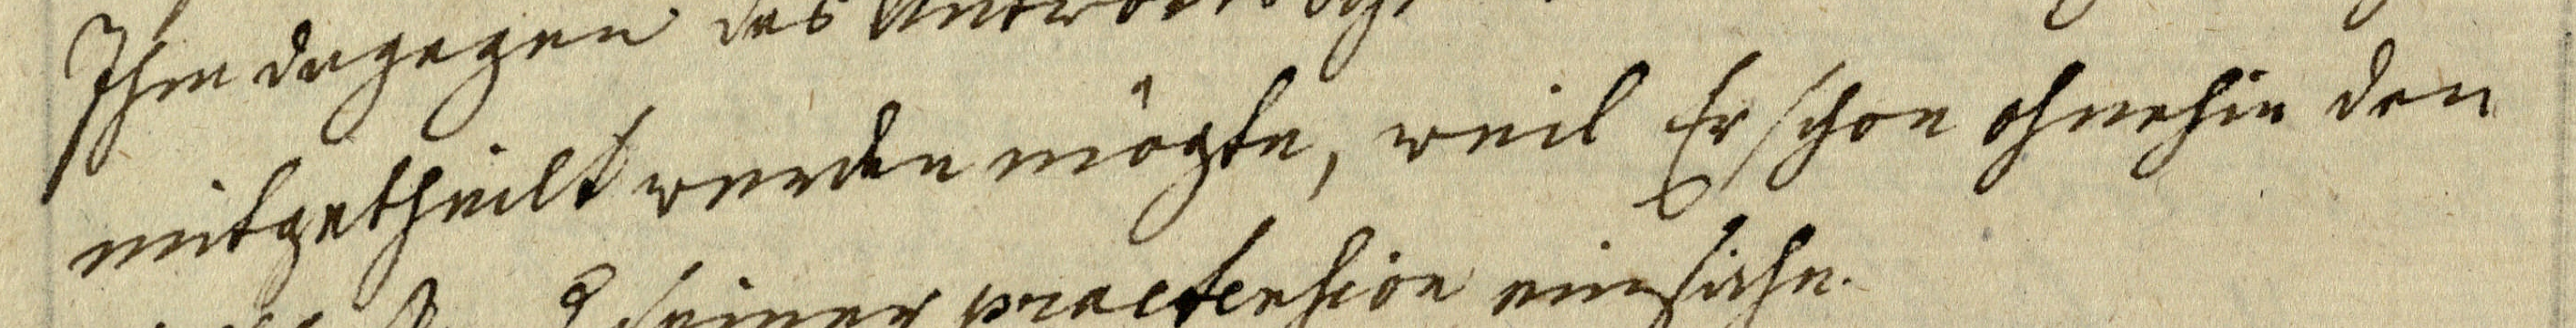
mitgetheilt werden mögte, weil Er schon ohnehin den
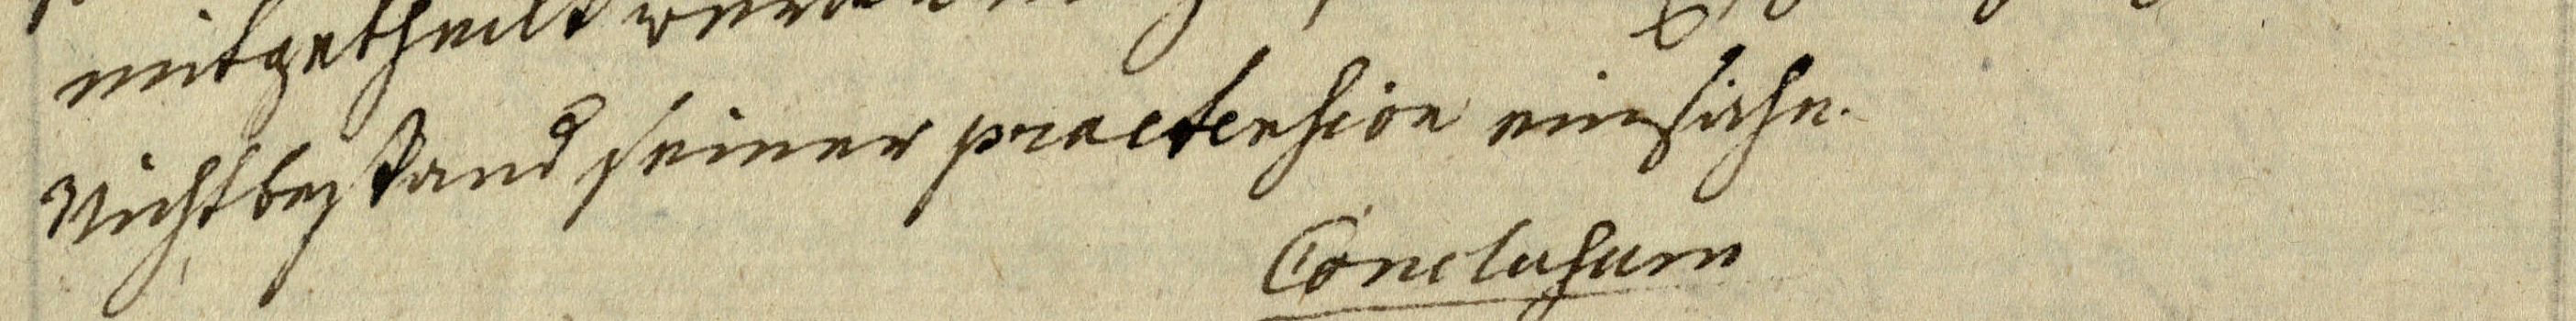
Nichtbestand seiner praetension einsähe.
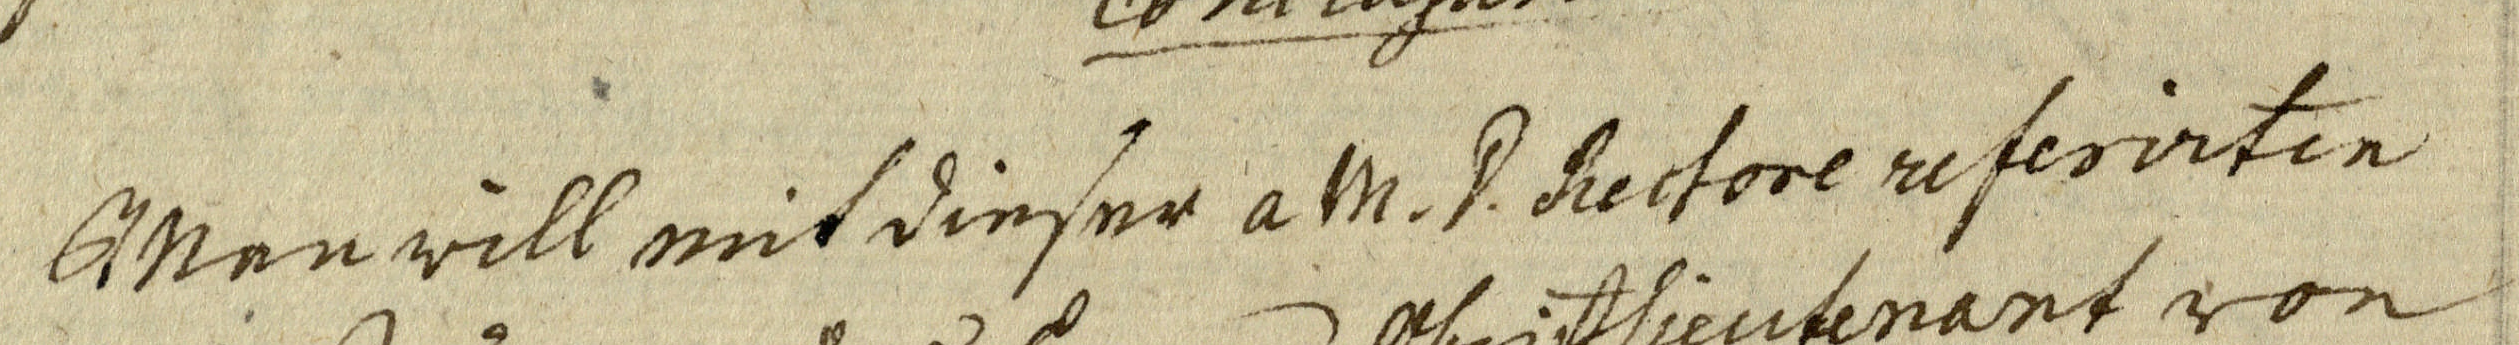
Man will mit dieser a. M. D. Rectore referirten
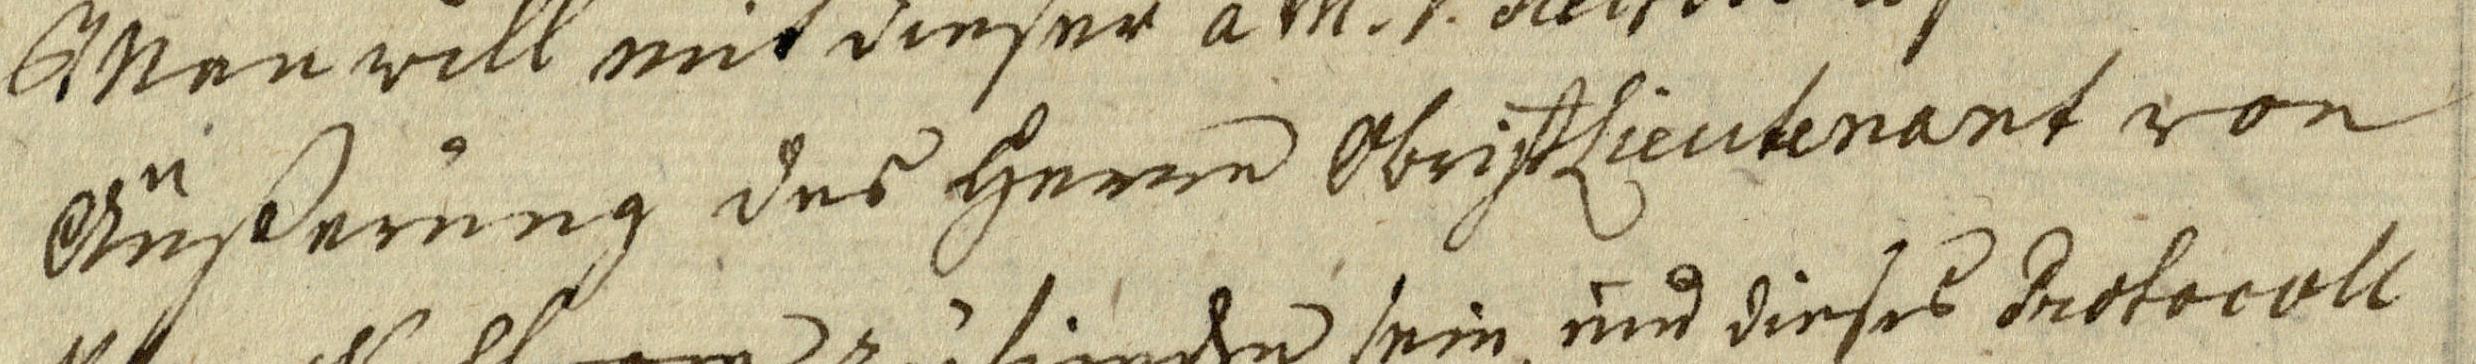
Äußerung des Herrn Obrist Lieutnant von
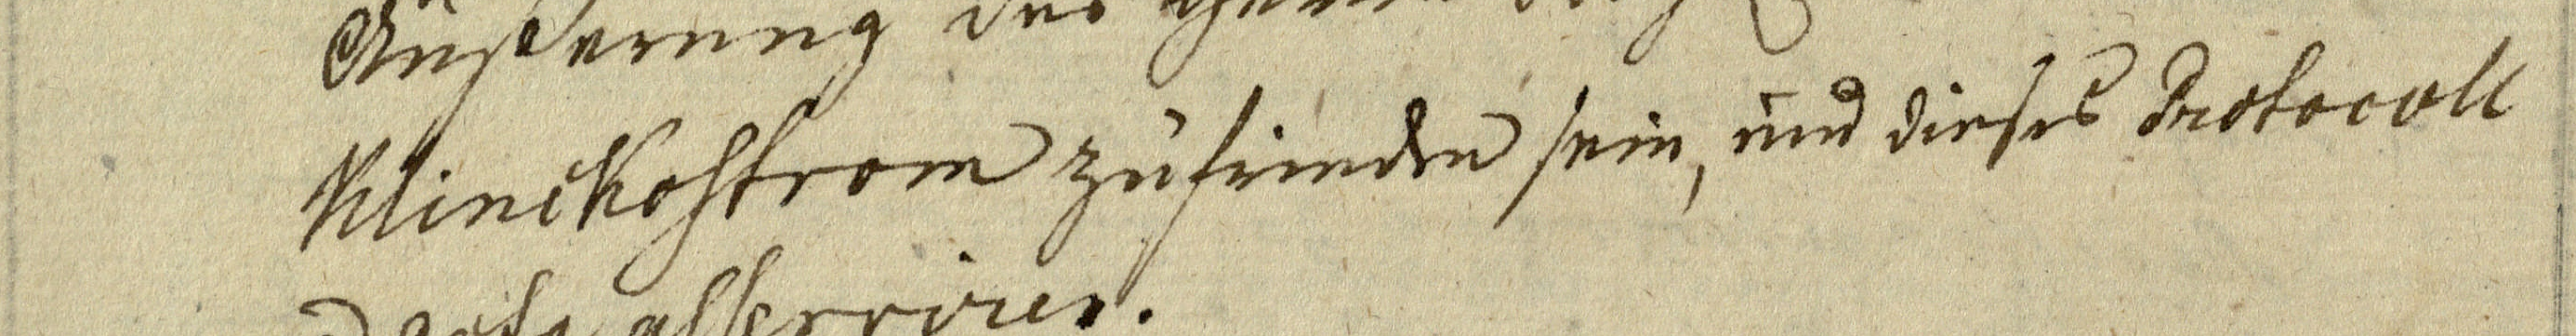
Klinckoström zufrieden sein, und dieses Protocoll
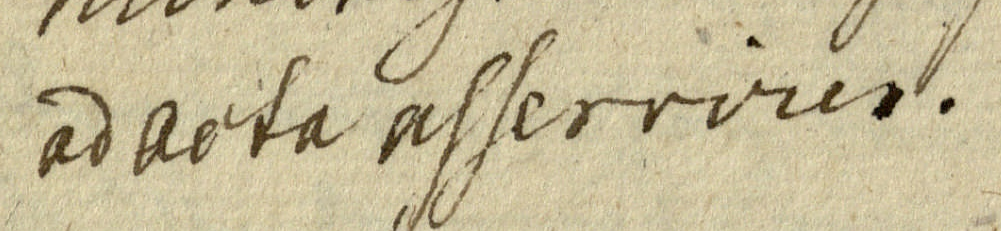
ad acta asserviren.
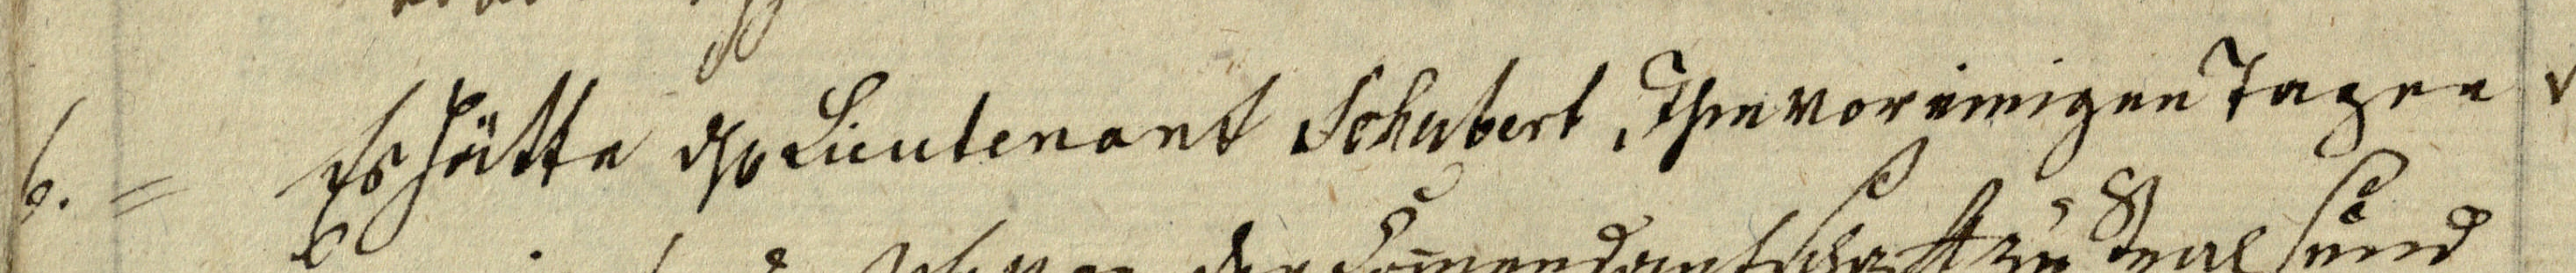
6. Es hätte dh. Lieutnant Schubert Ihm vor einigen Tagen
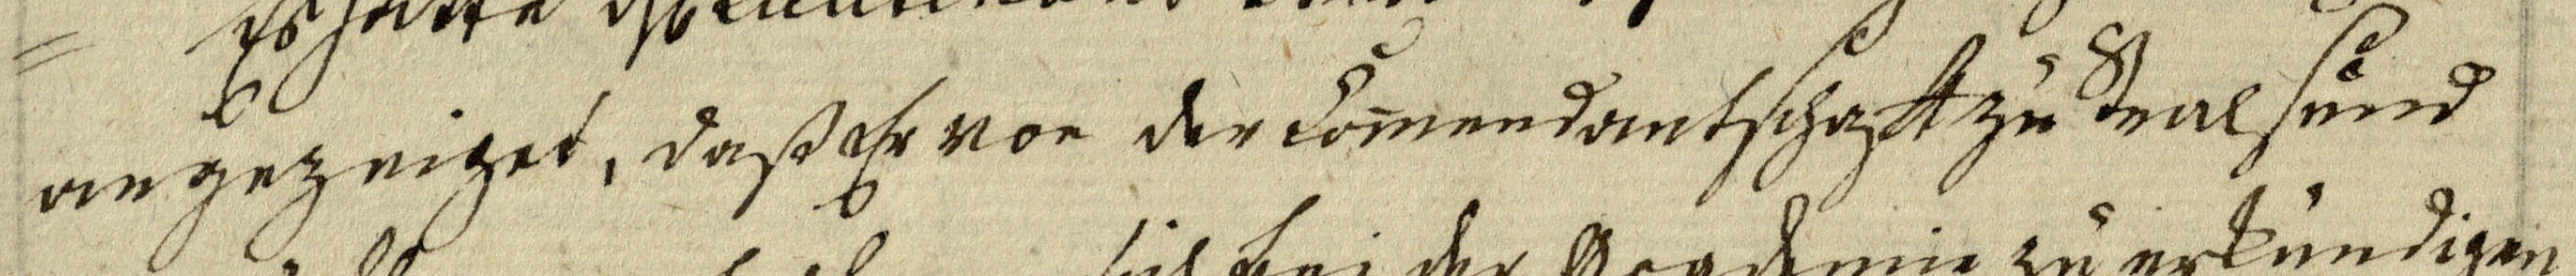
angezeiget, daß Er von der Comendantschaft zu Stralsund
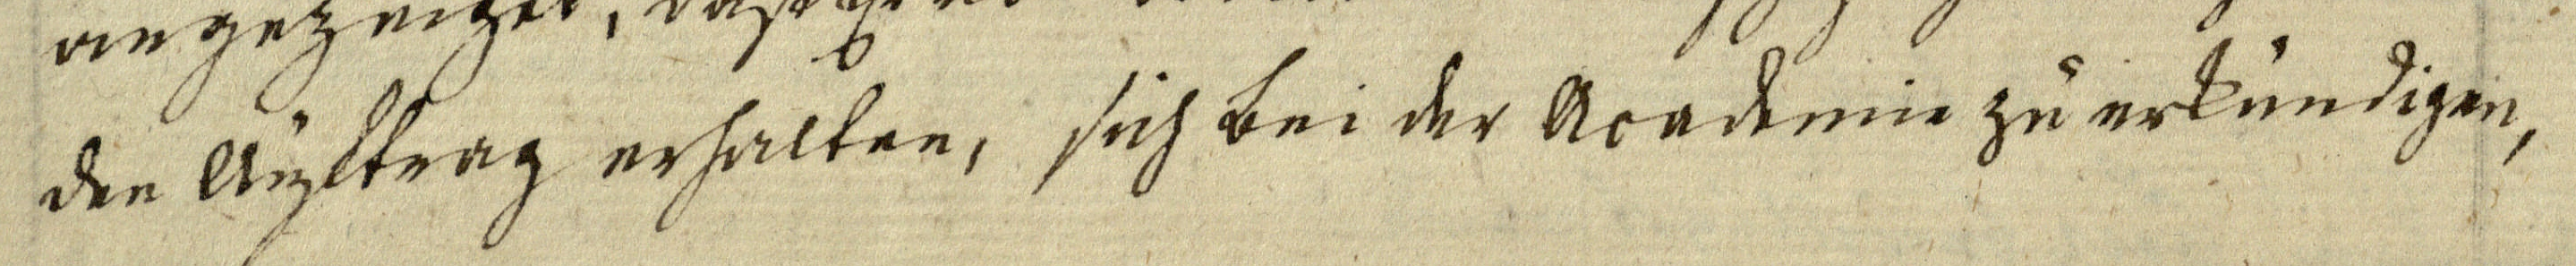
den Auftrag erhalten, sich bei der Academie zu erkundigen,
